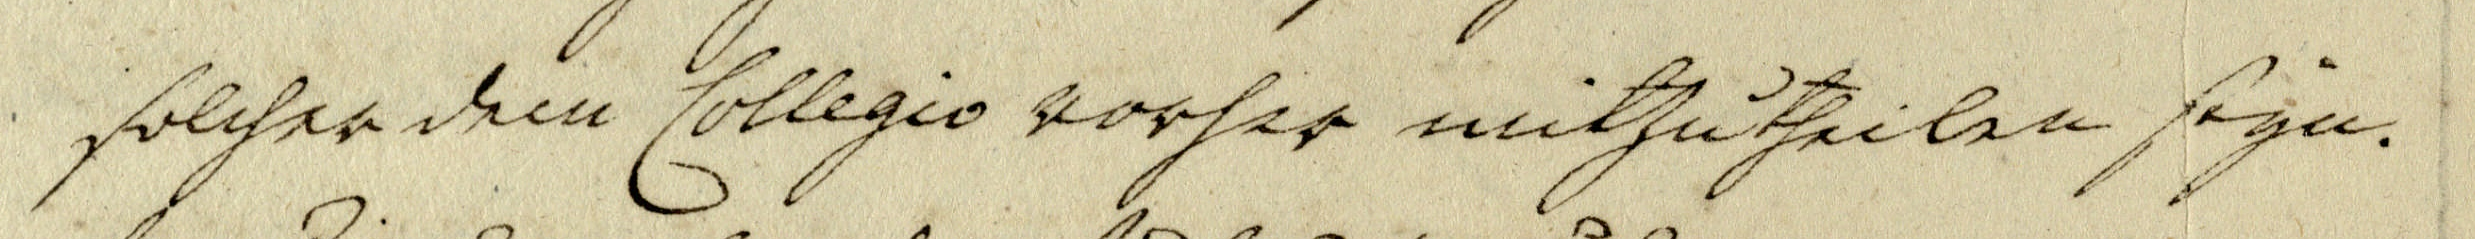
solcher dem Collegio vorher mitzutheilen seÿn.
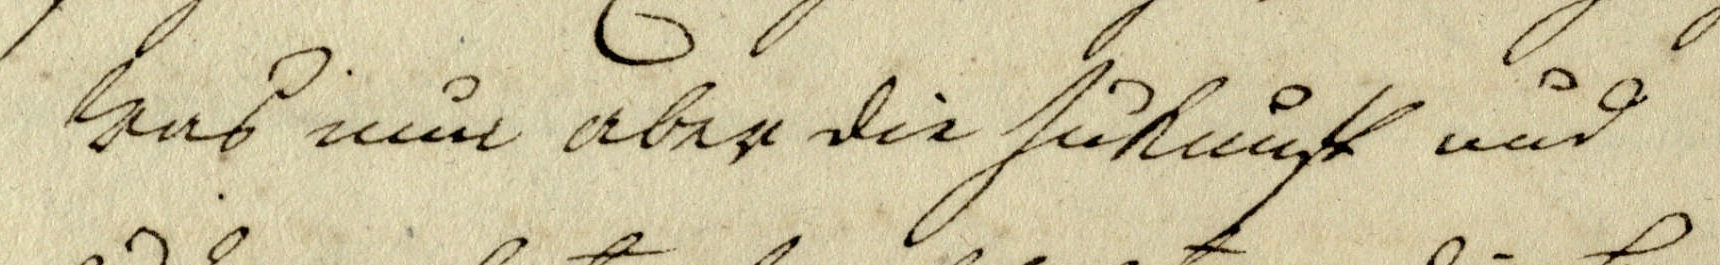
Was nun aber die Zukunft und
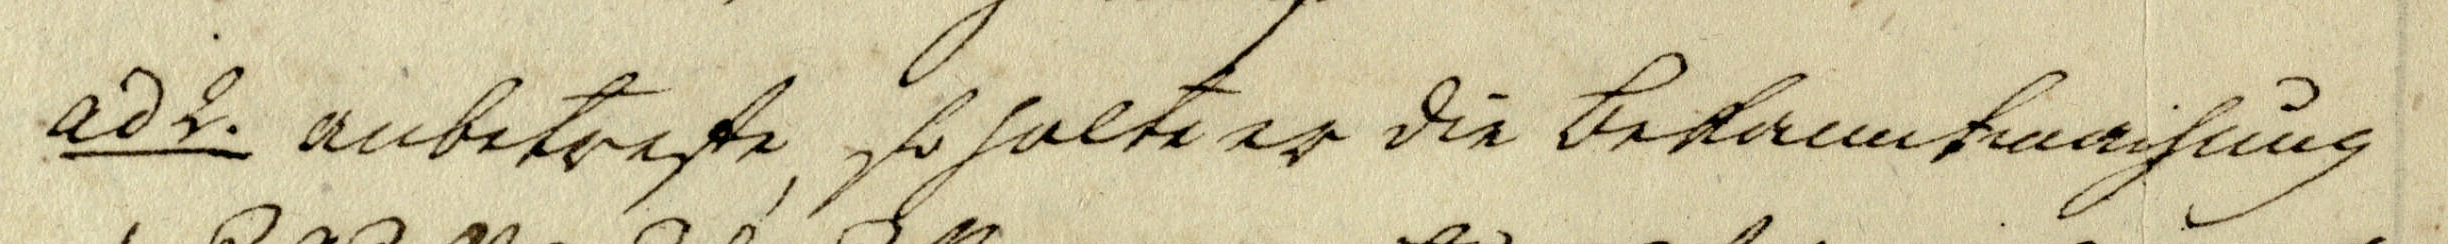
ad 2. anbetreffe, so halte er die Bekanntmachung
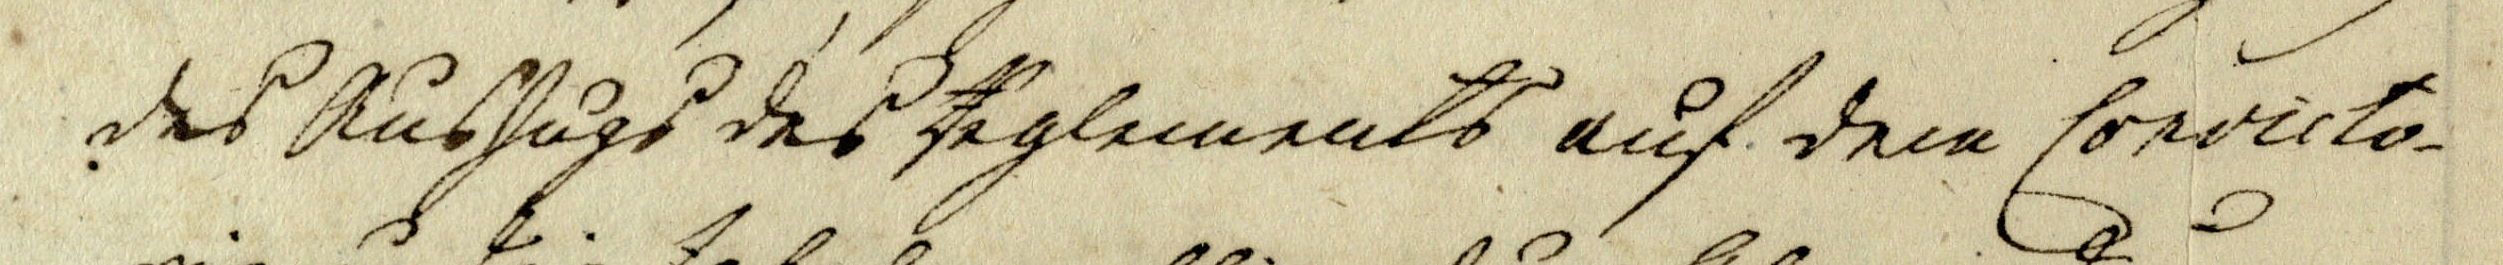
des Auszugs des Reglements auf dem Convicto¬
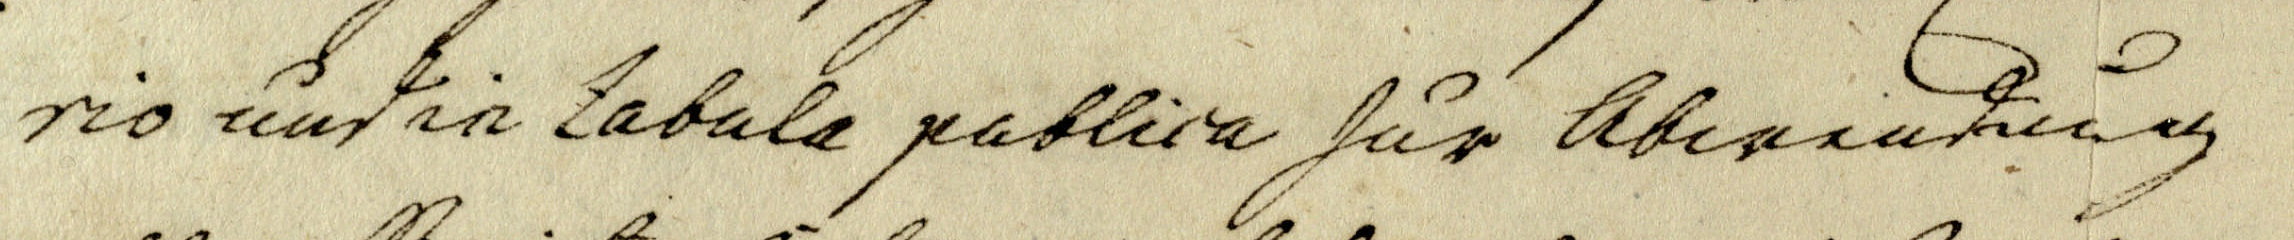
rio und in tabula publica zur Abwendung
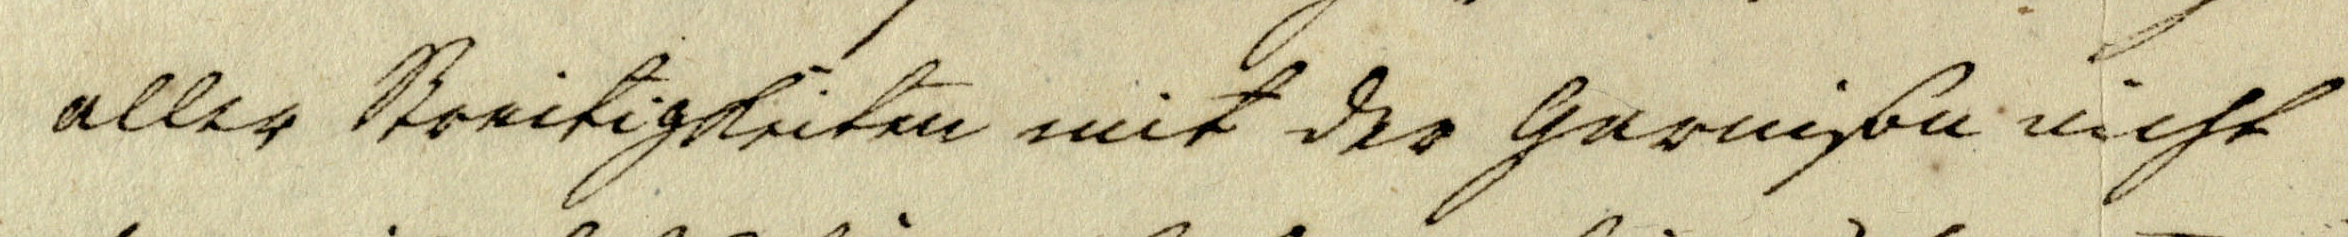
aller Streitigkeiten mit der Garnison nicht
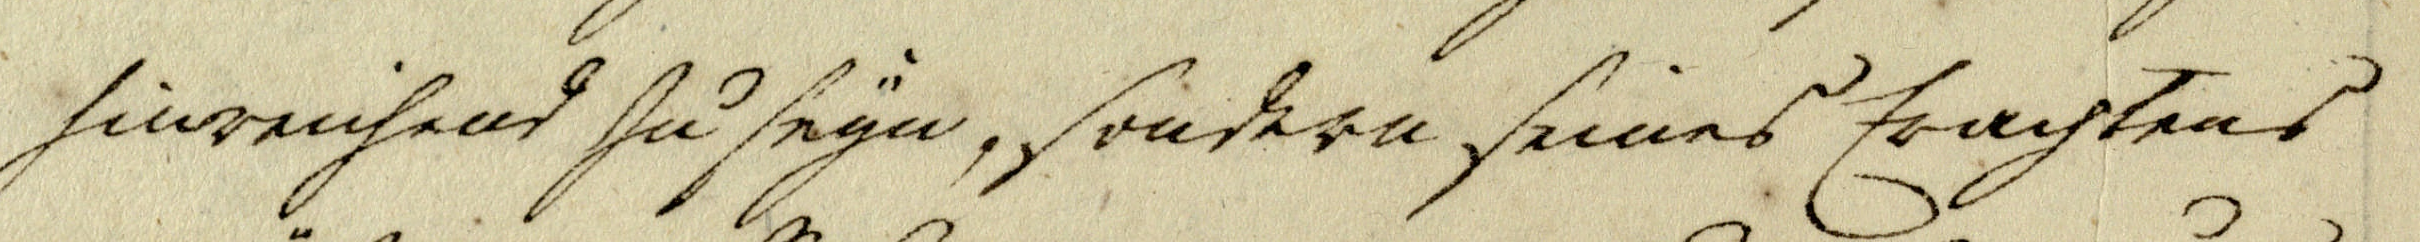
hinreichend zu seÿn, sondern seines Erachtens
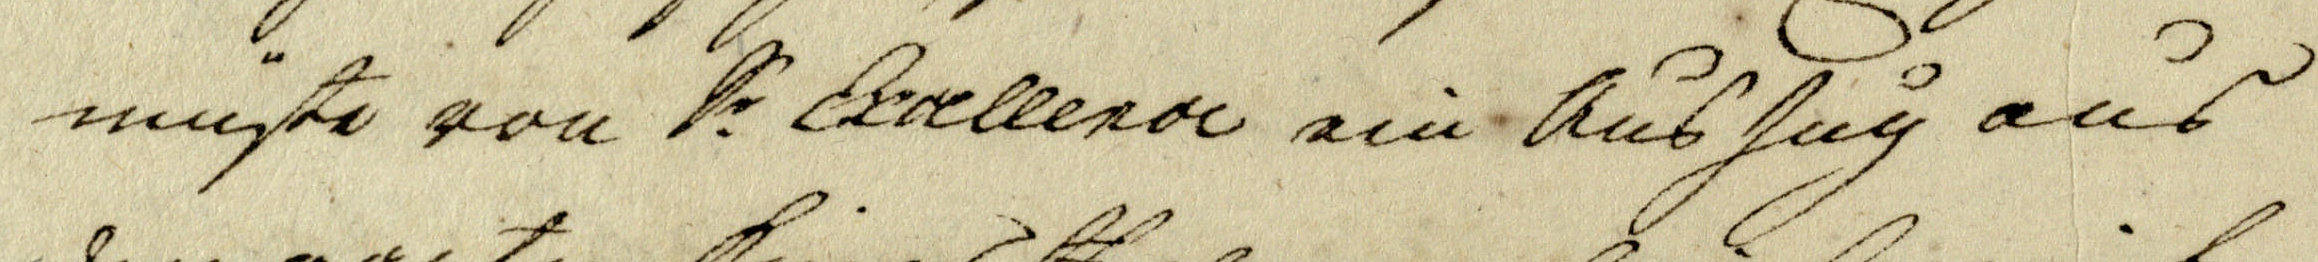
müßte von Sr Excellence ein Auszug aus
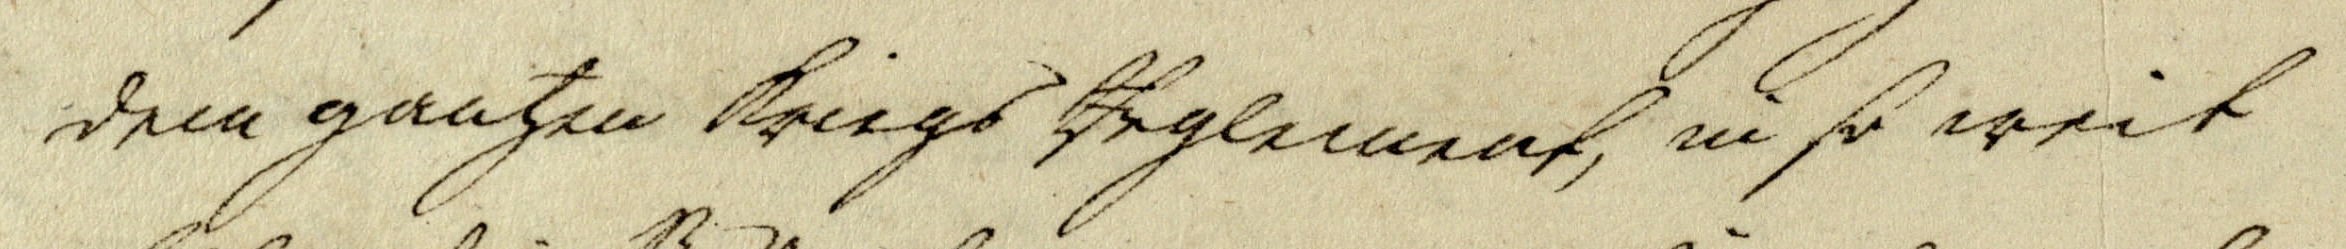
dem gantzen Kriegs Reglement, in so weit
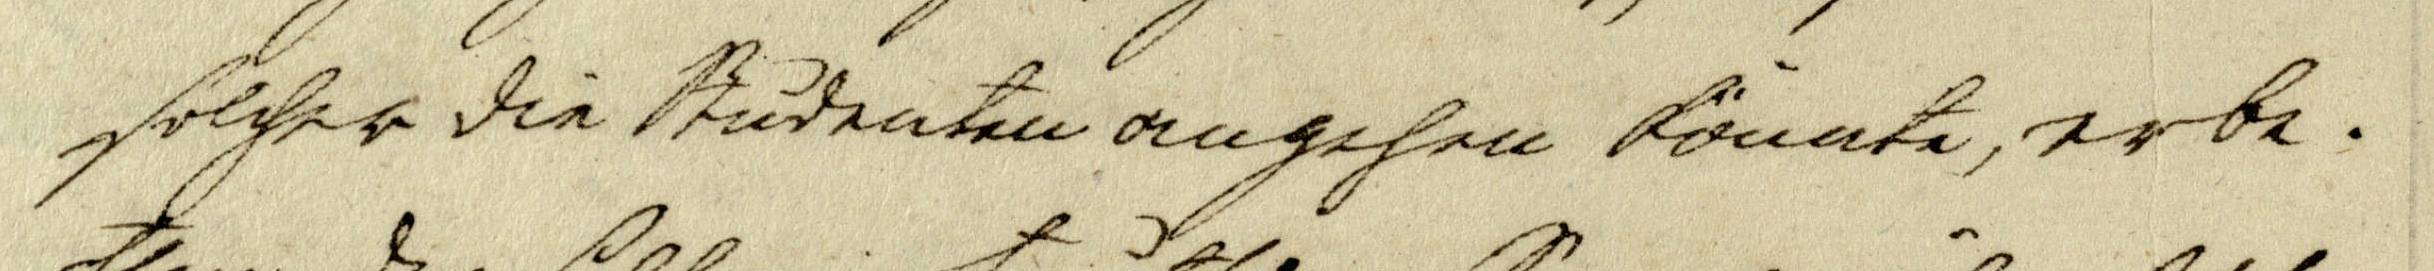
solcher die Studenten angehen könnte, erbe¬
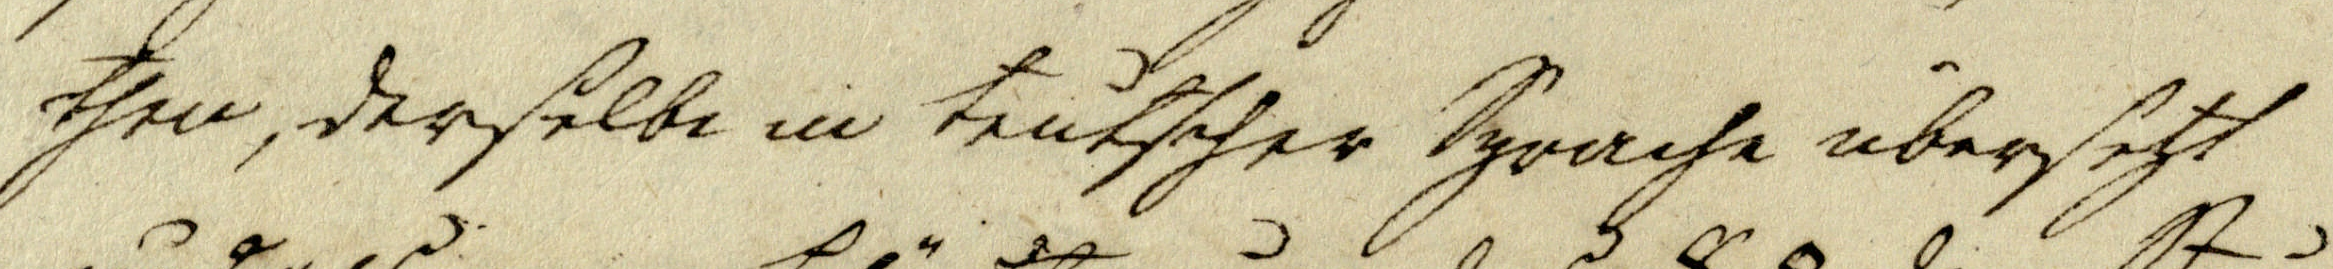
then, derselbe in teutscher Sprache übersetzt
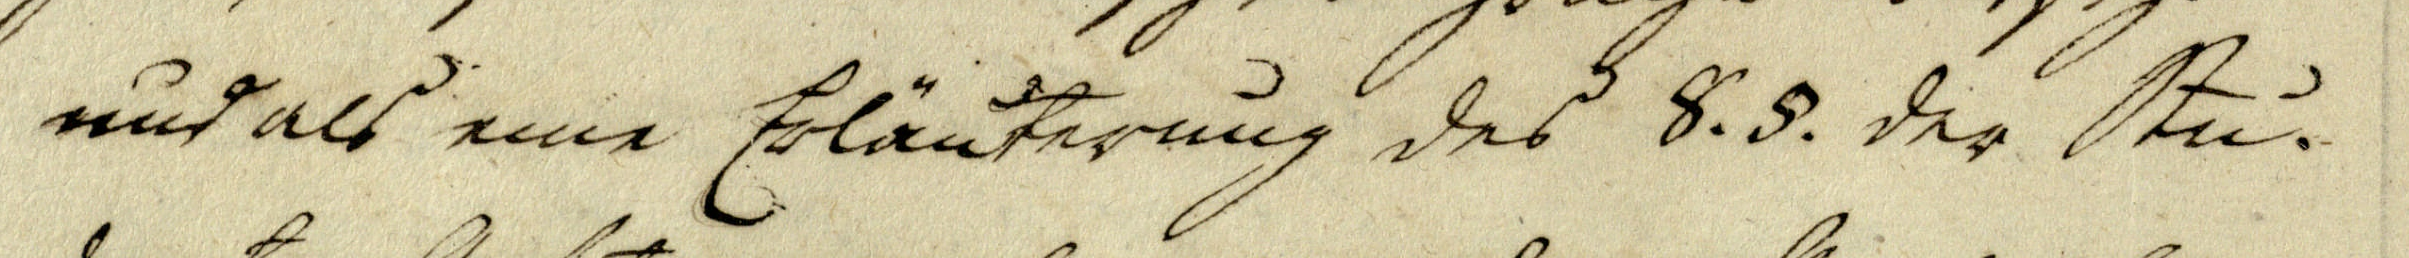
und als eine Erläuterung des §. 5. der Stu¬
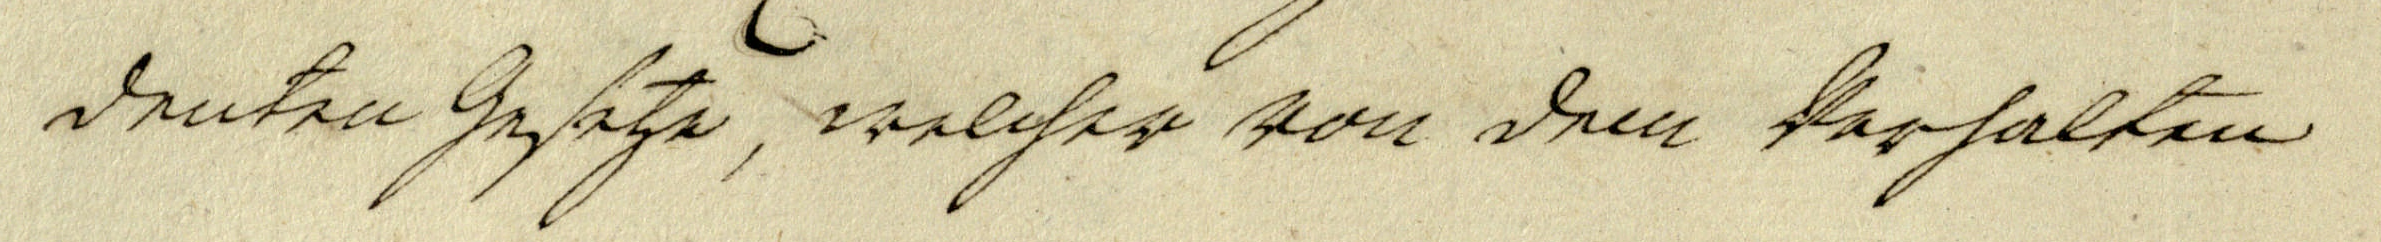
denten Gesetze, welcher von dem Verhalten
